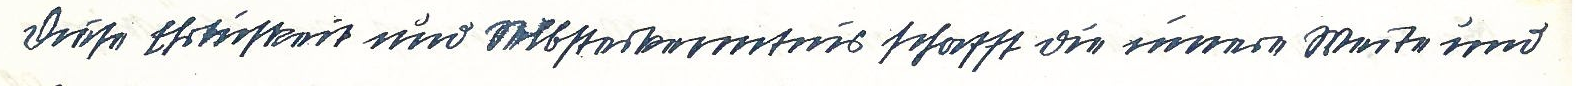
Diese Ehrlichkeit und Selbsterkenntnis schafft die innere Weite und
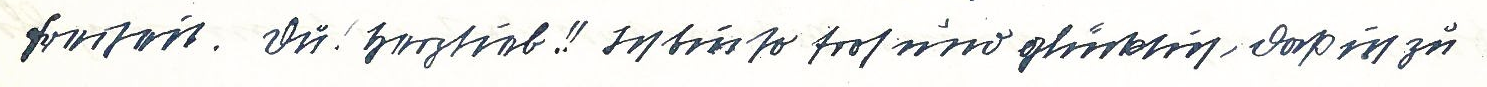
Freiheit. Du! Herzlieb!! Ich bin so froh und glücklich, daß ich zu
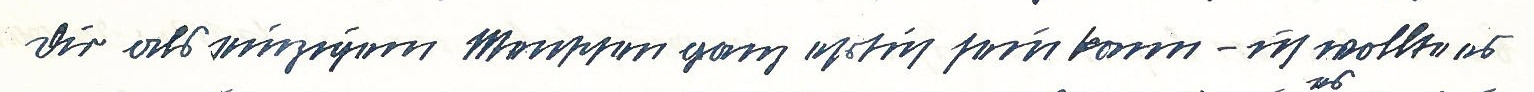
Dir als einzigem Menschen ganz ehrlich sein kann – ich wollte es
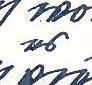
es
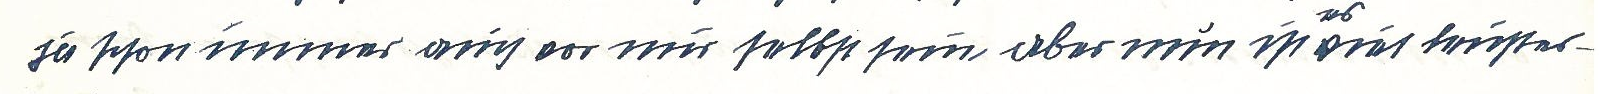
ja schon immer auch vor mir selbst sein, aber nun ist viel leichter –
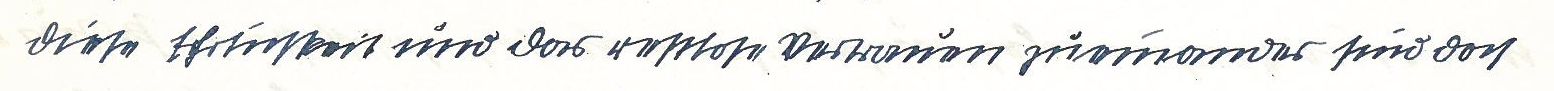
diese Ehrlichkeit und das restlose Vertrauen zueinander sind doch
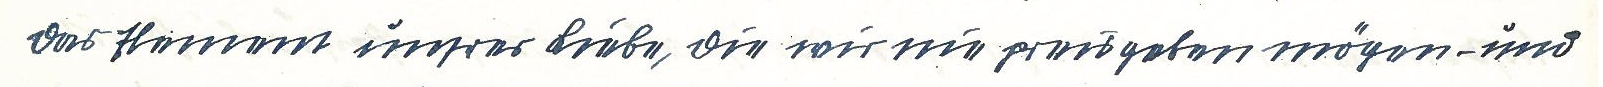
das Element unsrer Liebe, die wir nie preisgeben mögen – und
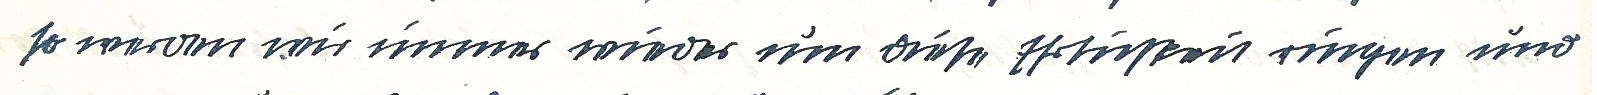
so werden wir immer wieder um diese Ehrlichkeit ringen und
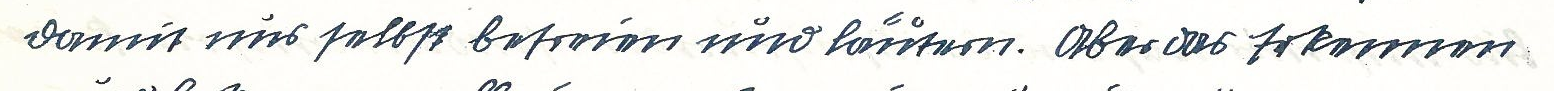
damit uns selbst befreien und läutern. Aber das Erkennen
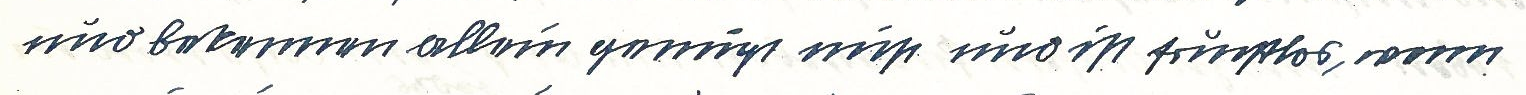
und Bekennen allein genügt nicht und ist fruchtlos, wenn
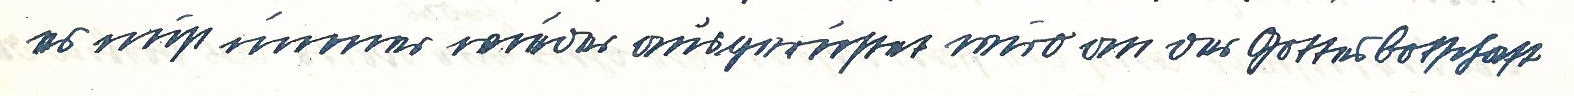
es nicht immer wieder ausgerichtet wird an der Gottesbotschaft
